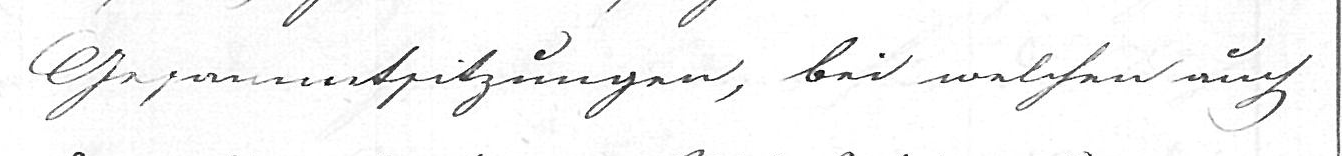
Gesammtsitzungen, bei welchen auch
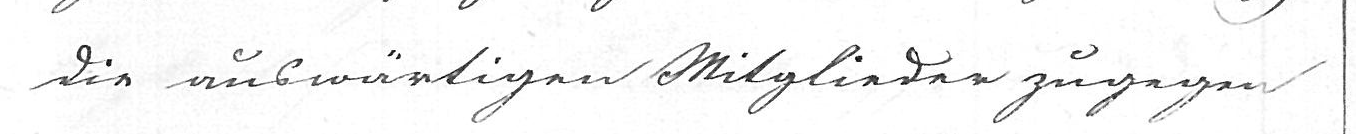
die auswärtigen Mitglieder zugegen
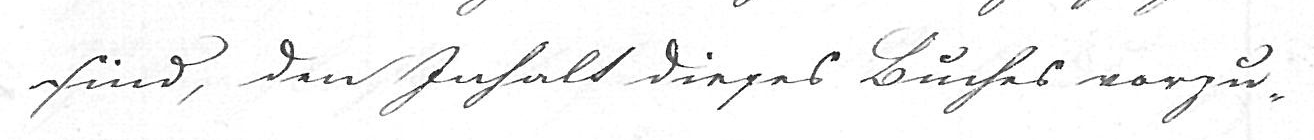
sind, den Inhalt dieses Buches vorzu-
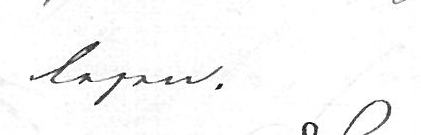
lesen.
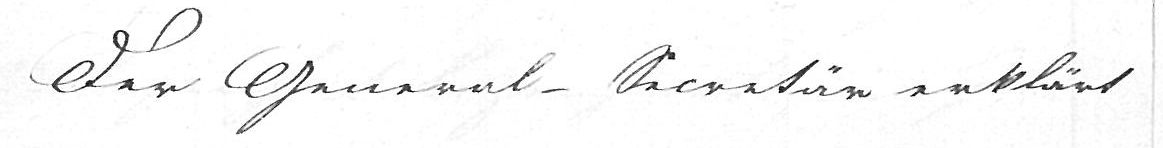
Der General-Secretär erklärt
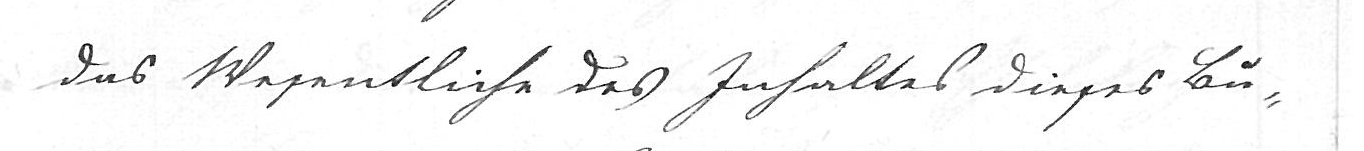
das Wesentliche des Inhaltes dieses Bu-
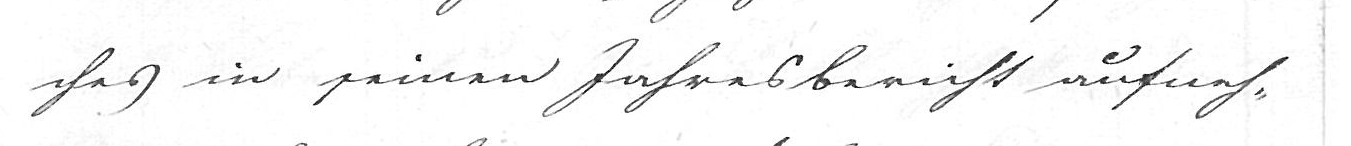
ches in seinen Jahresbericht aufneh-
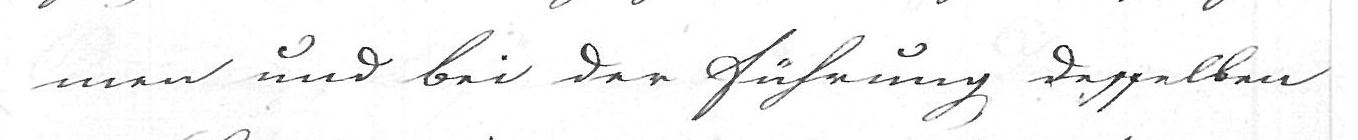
men und bei der Führung desselben
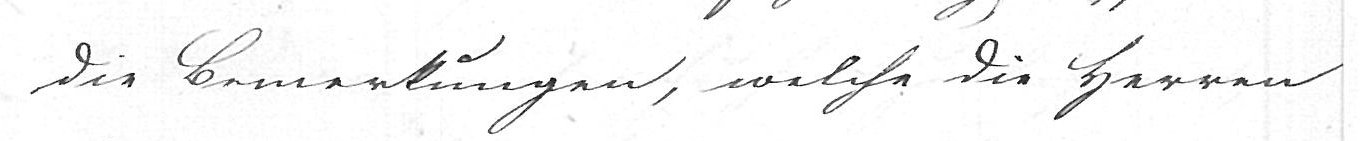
die Bemerkungen, welche die Herren
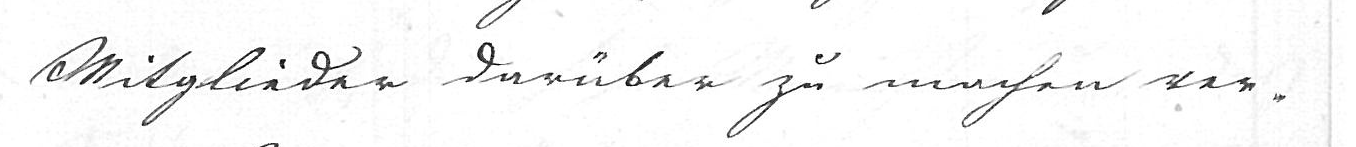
Mitglieder darüber zu machen ver-
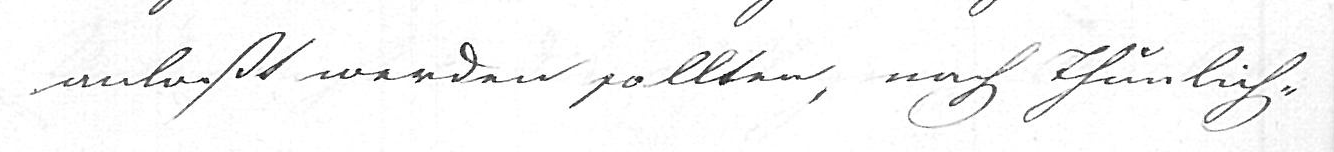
anlaßt werden sollten, nach Thunlich-
